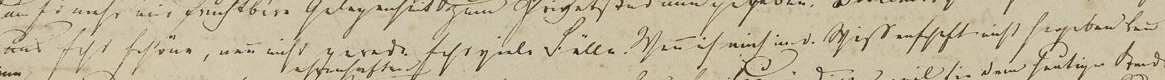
uns sehr schöne, wenn nicht gerade sehr viele Fälle. Wenn ich mich in d. Wissenschaft nicht hergeben kann
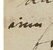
eine
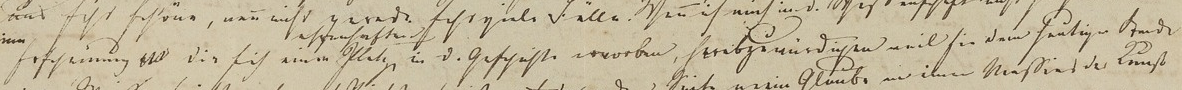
Erscheinung die sich einen ehrenhaften Platz in d. Geschichte erworben, herabzuwürdigen weil sie dem heutigen Stande
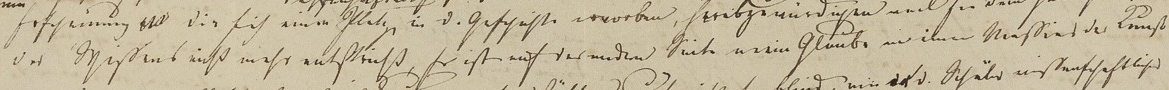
des Wissens nicht mehr entspricht, so ist auf der andern Seite mein Glaube an einen Messias der Kunst
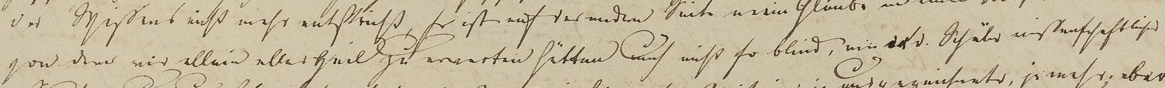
von dem wir allein alles Heil zu erwarten hätten auch nicht so blind, wie er d. Schüler wissenschaftlicher
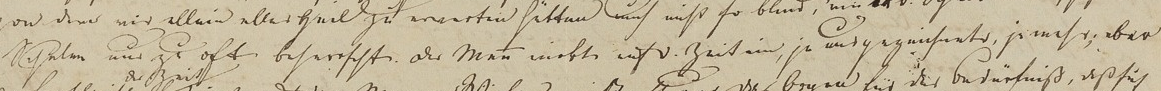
Schulen nur zu oft beherrscht. Der Mann wirkt auf d. Zeit ein, je ausgezeichneter, je mehr; aber
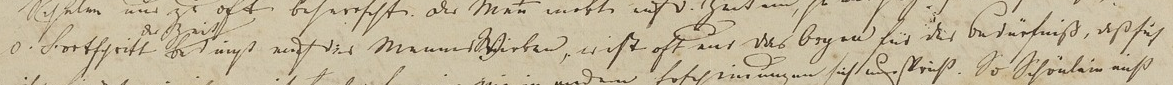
d. Fortschritt der Zeit bedingt auch des Mannes Wirken, er ist oft nur das Organ für das Bedürfniss, daß sich
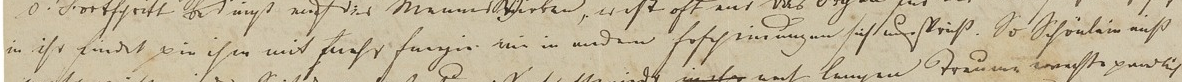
in ihr findet & in ihm mit mehr Energie wie in andern Erscheinungen sich ausspricht. So Schönlein nicht
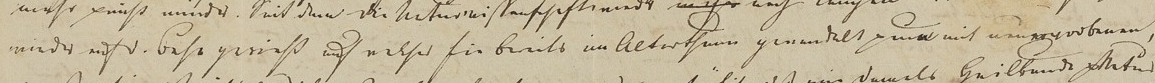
wieder auf d. Bahn gerieht auf welcher sie bereits im Alterthume gewandelt & nun mit neuerworbenen,
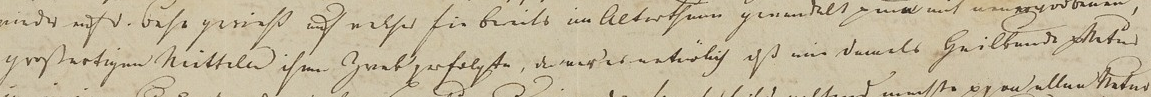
großartigen Mitteln ihrem Zwek verfolgte, da war es natürlich dß wie damals Heilkunde & Natur
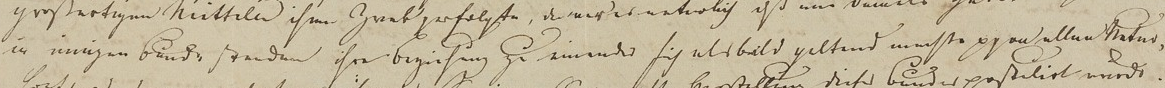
in einigen Bunde standen ihre Beziehung zu einander sich alsbald geltend machte & von allen Natur-
